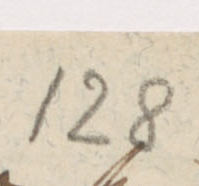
128
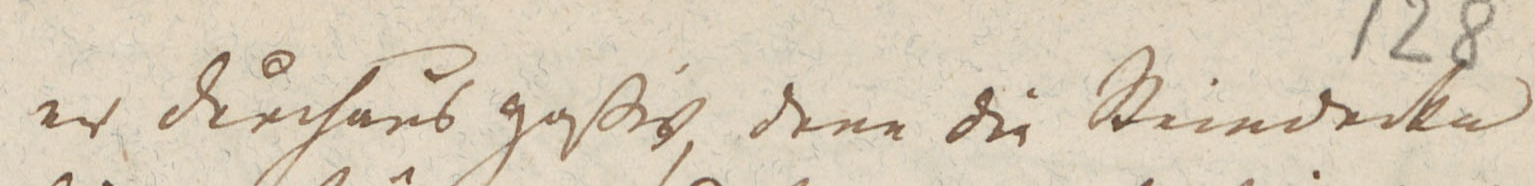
er durchaus passiv, denn die Steindecke
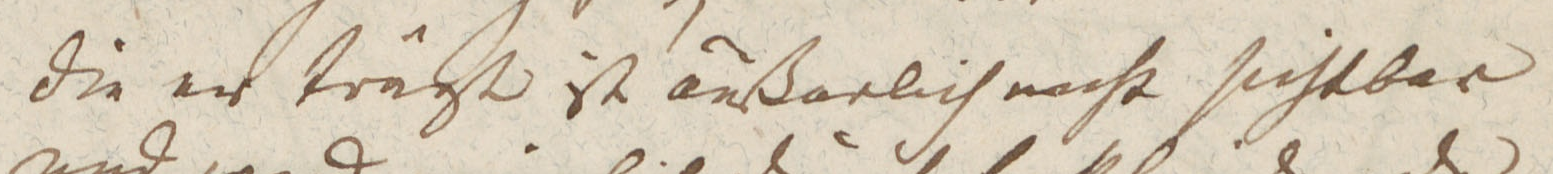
die er trägt ist äusserlich nicht sichtbar
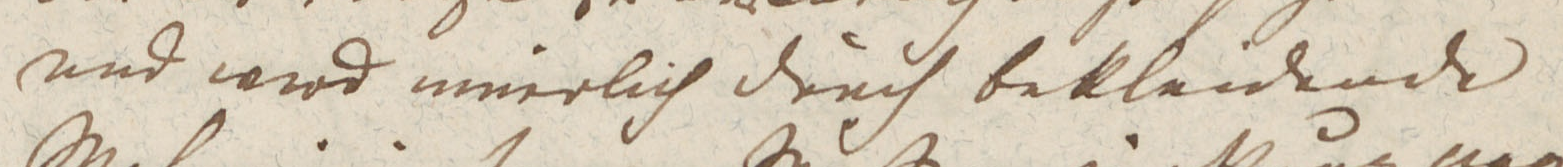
und wird innerlich durch bekleidende
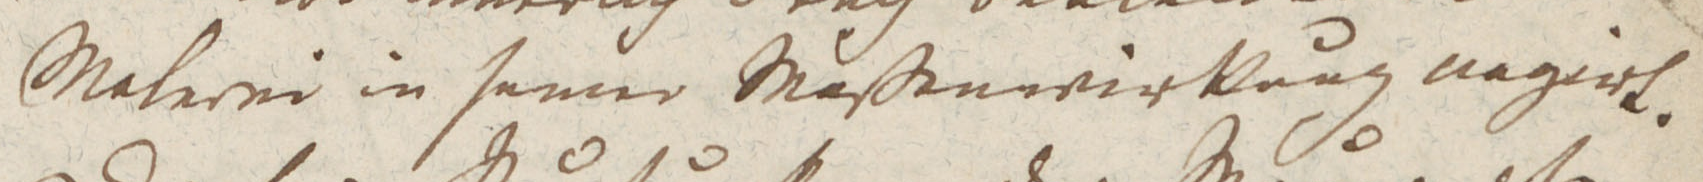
Malerei in seiner Massenwirkung negirt.
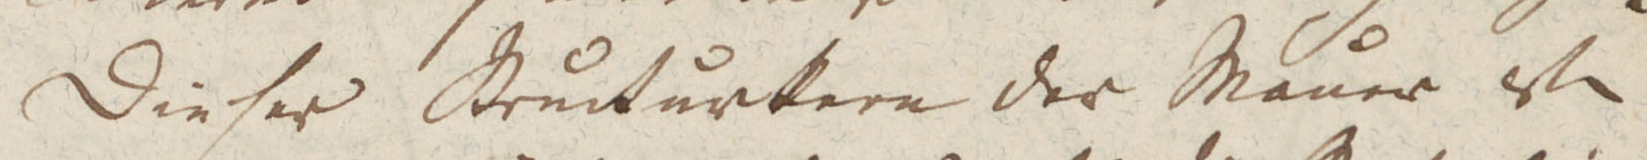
Dieser Strukturkern der Mauer ist
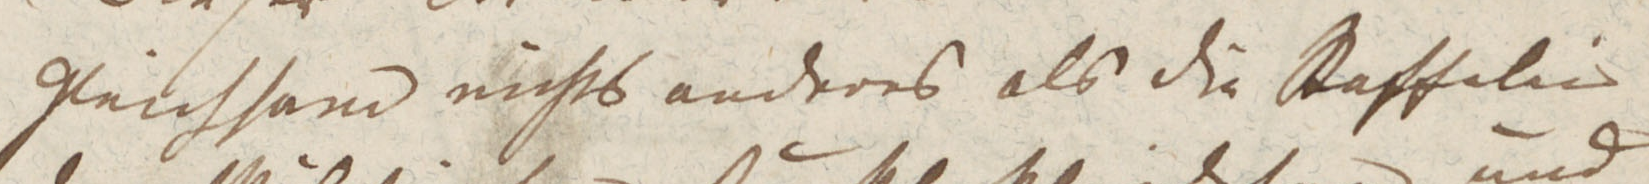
gleichsam nichts anderes als die Staffelei
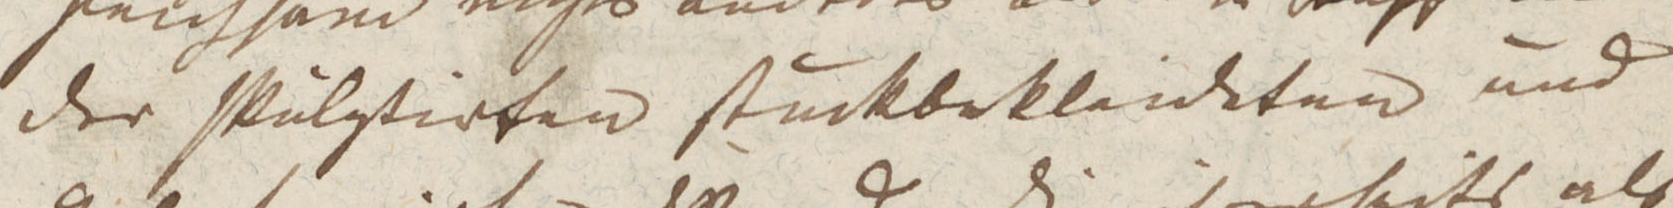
der skulptirten stuckbekleideten und
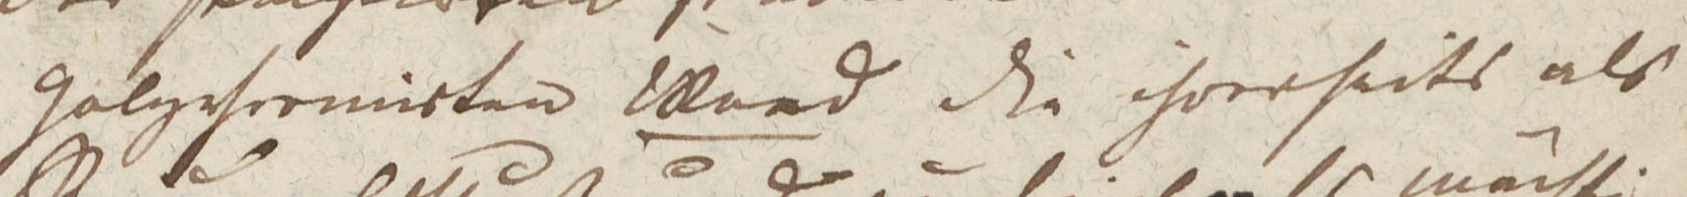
polychromirten Wand die ihrerseits als
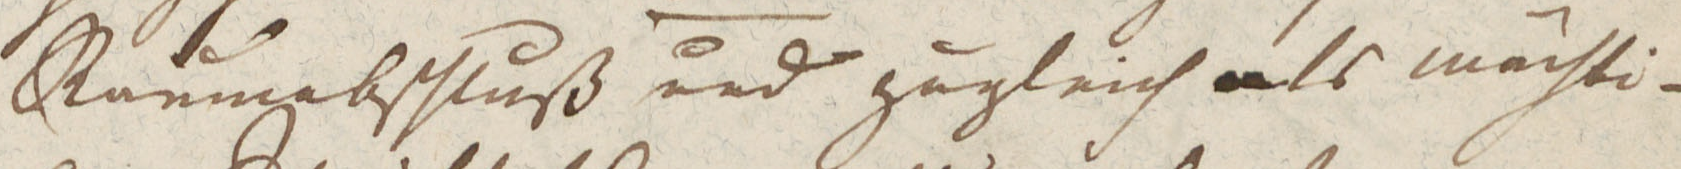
Raumabschluss und zugleich als mächti-
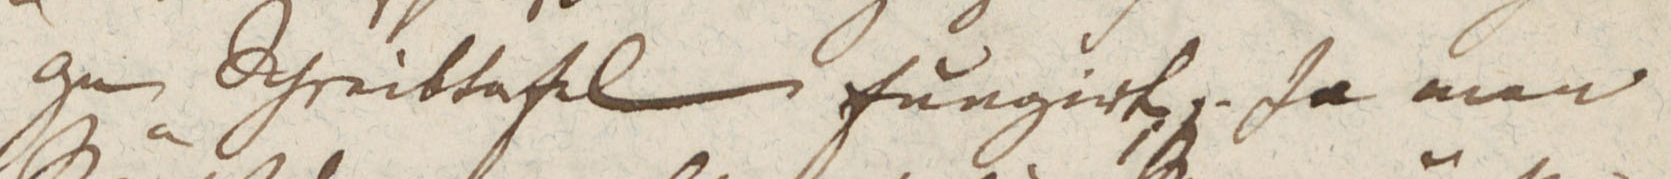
ge Schreibtafel fungirt;, Ja man
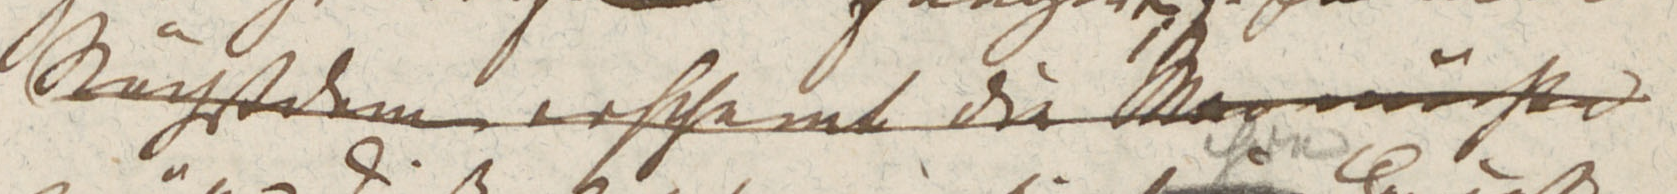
Nächstdem erscheint die Mauernähte
